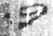月
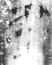○（建）
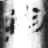於
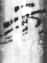亥
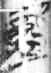○（陷）
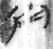於
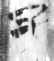子
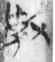○（破）
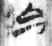於
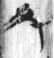丑
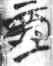坪（平）
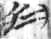於
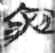寅
